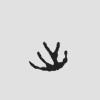出
